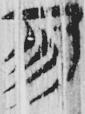淵
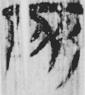所
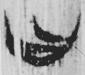曰
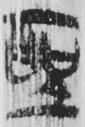聖
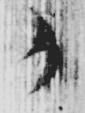人
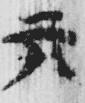亓（其）
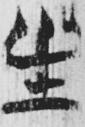生
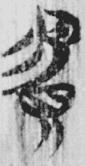賜
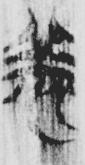羕（養）
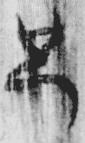也
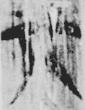亓（其）
